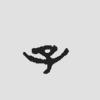子
